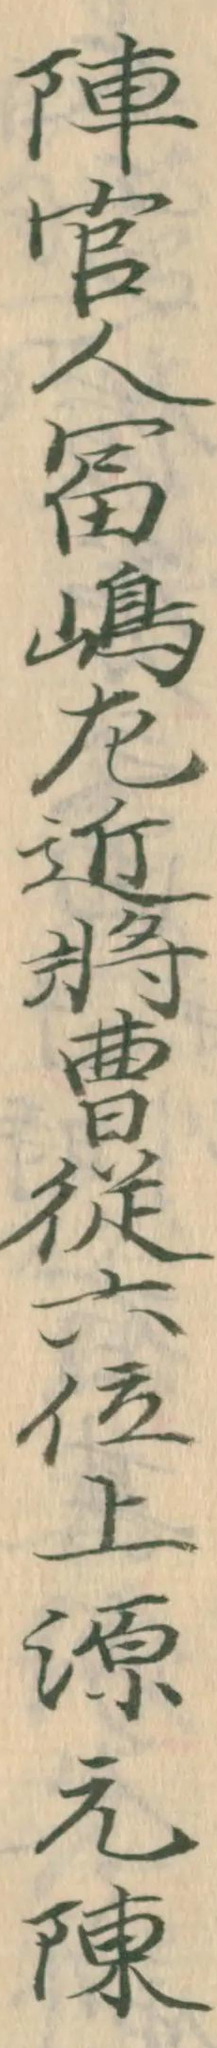陣官人冨嶋左近將曹従六位上源元陳
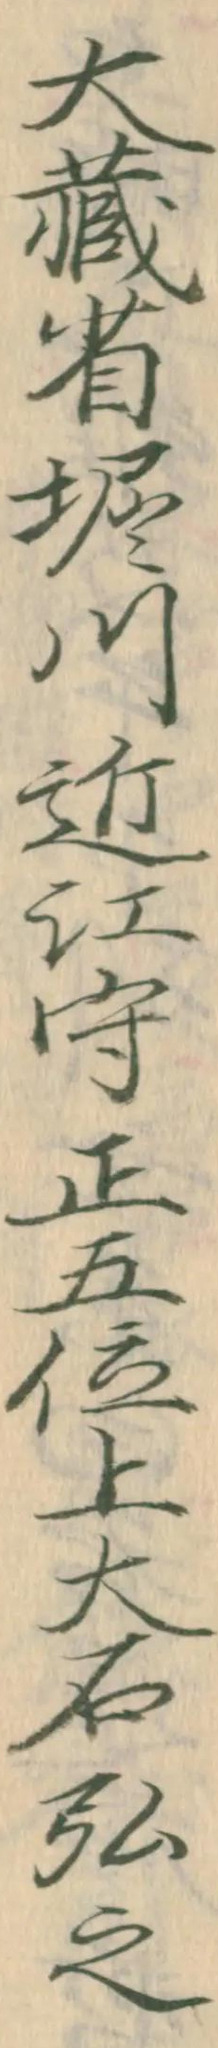大蔵省堀川近江守正五位上大石弘之
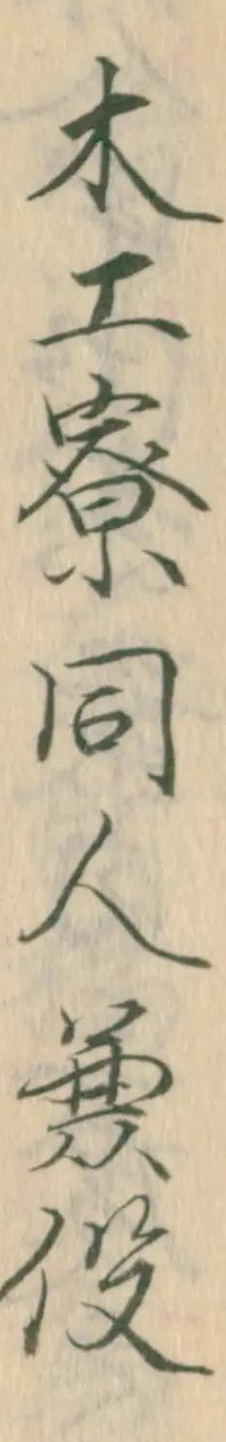木工寮同人兼役
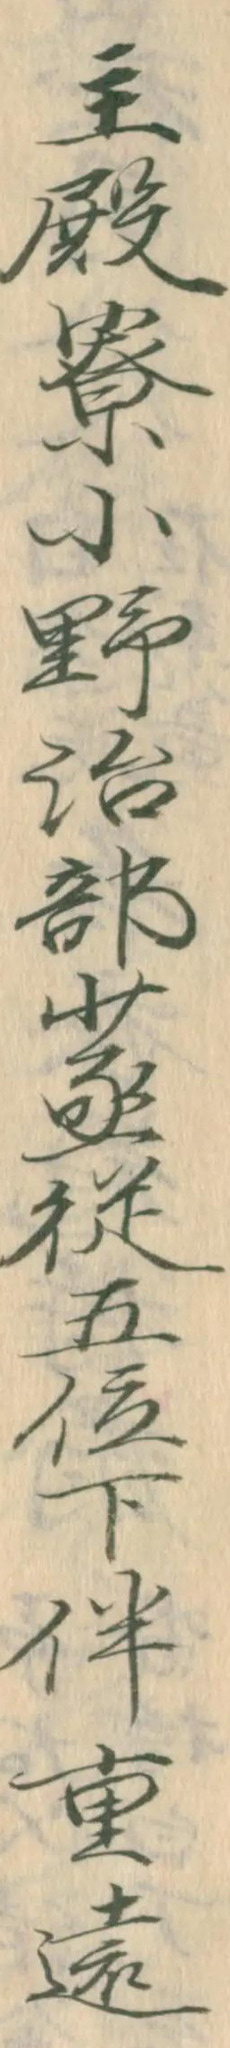主殿寮小野治部少丞従五位下伴重遠
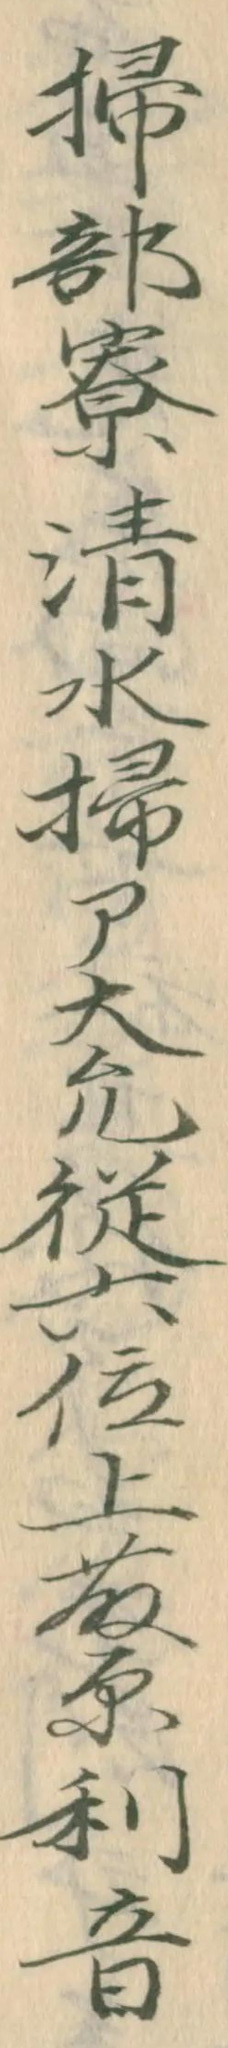掃部寮清水掃部大允従六位上藤原利音
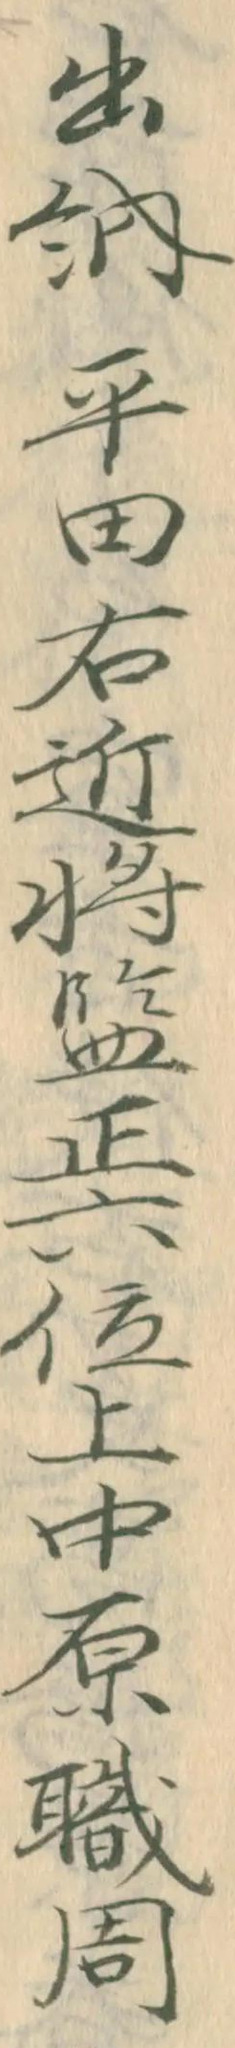出納平田右近将監正六位上中原職周
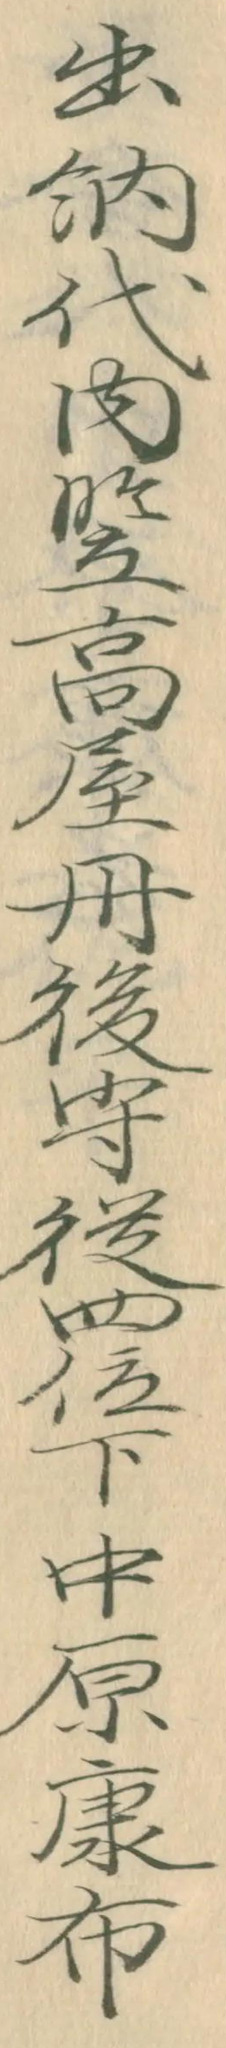出納代内竪高屋丹後守従四位下中原康布

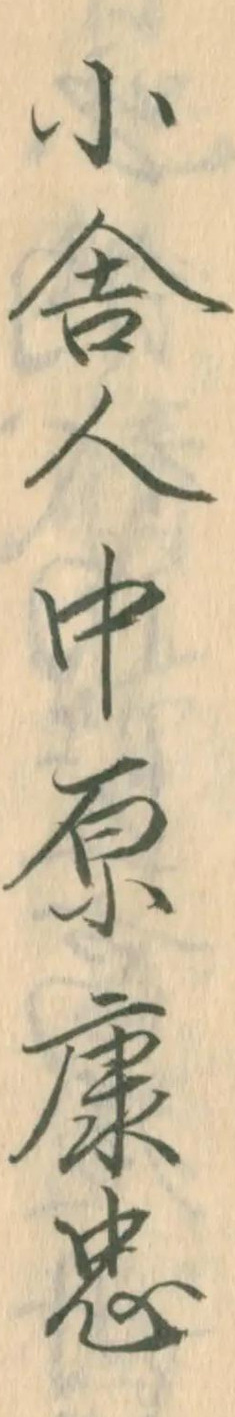小舎人中原康忠
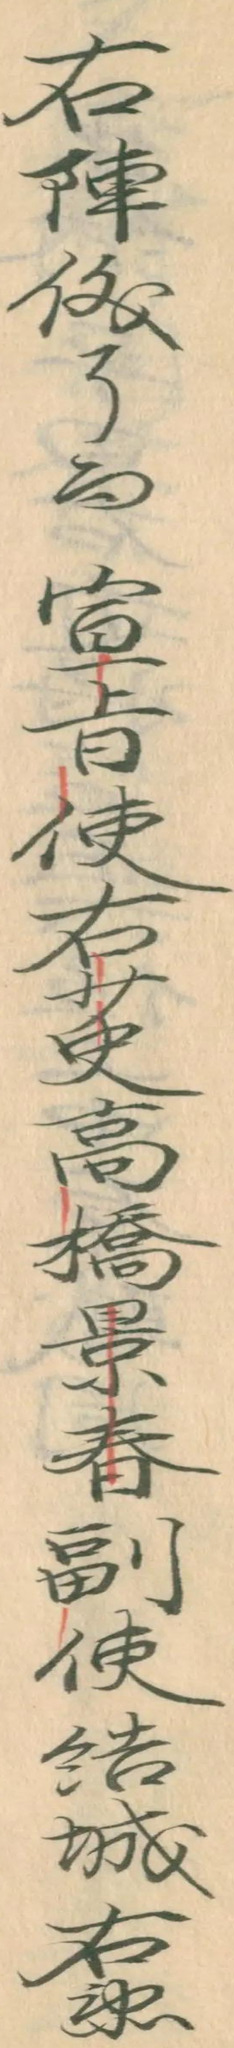右陣儀了而宣-旨_使右-少-史高_橋景春副_使結城右衛
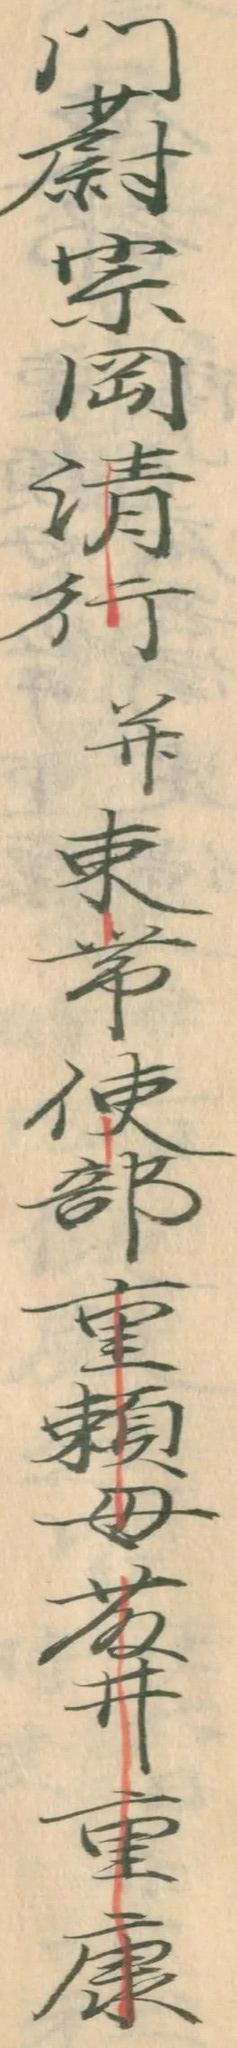門少尉宗岡清行并束-帯使-部重頼母藤井重康
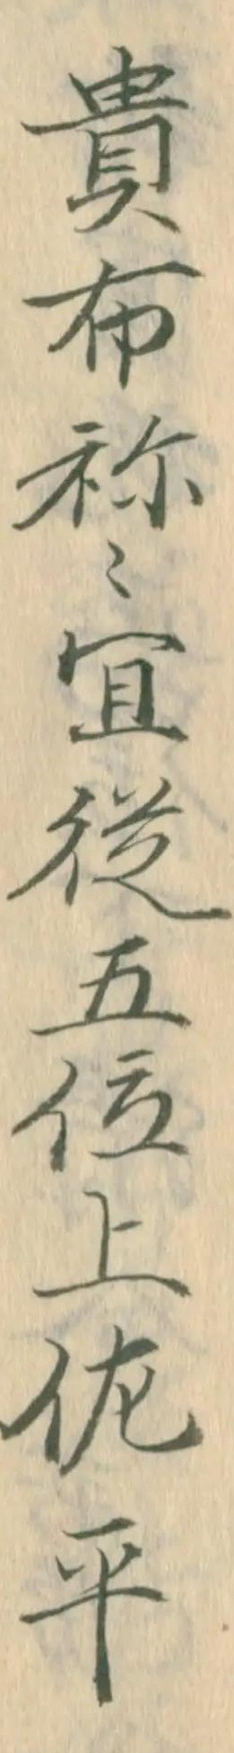貴布祢々宜従五位上佐平

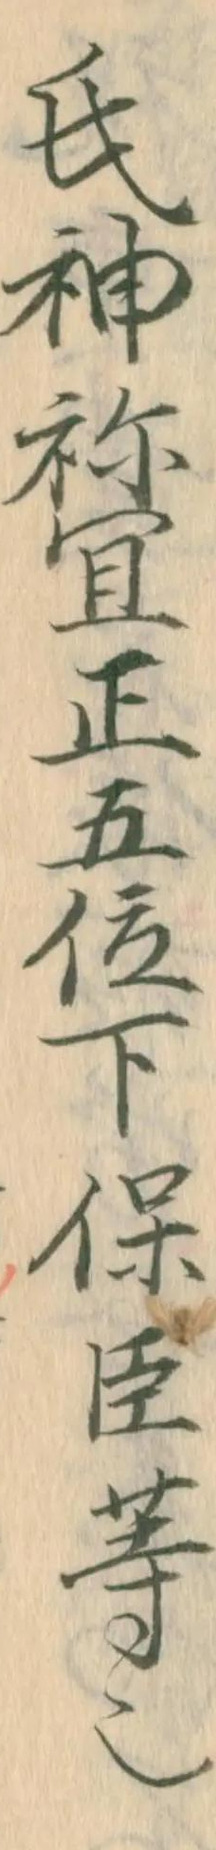氏神祢宜正五位下保臣等也

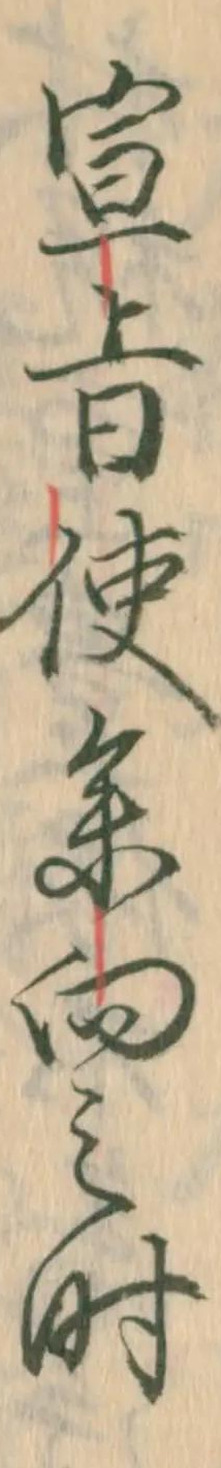宣-旨_使参-向之時
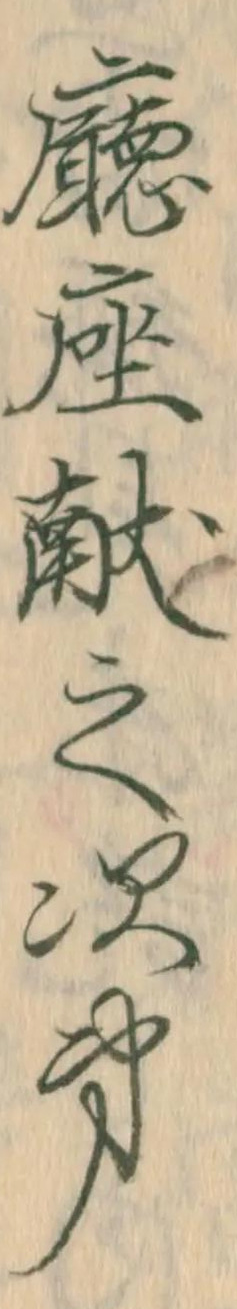庁座献之次第

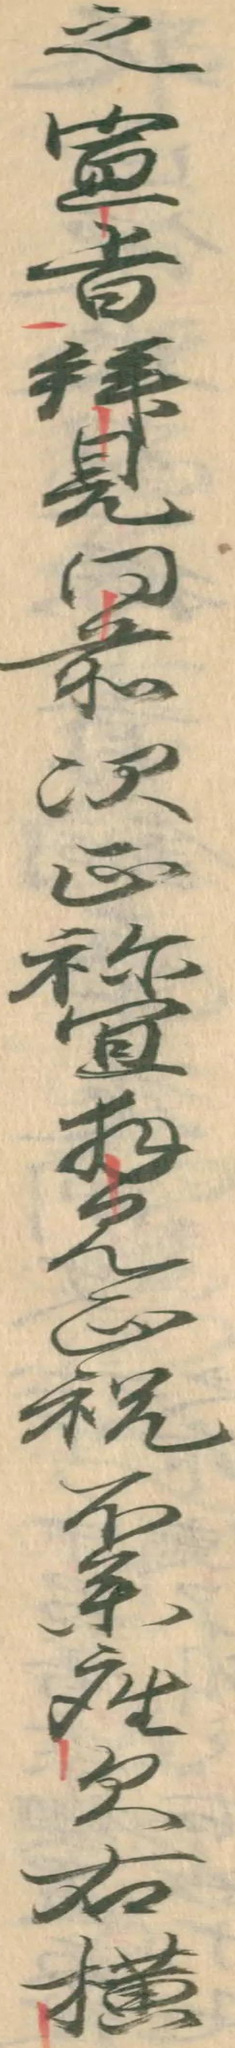之宣-旨拝-見同-前次正祢宜拝-見正祝不参座_欠右横_
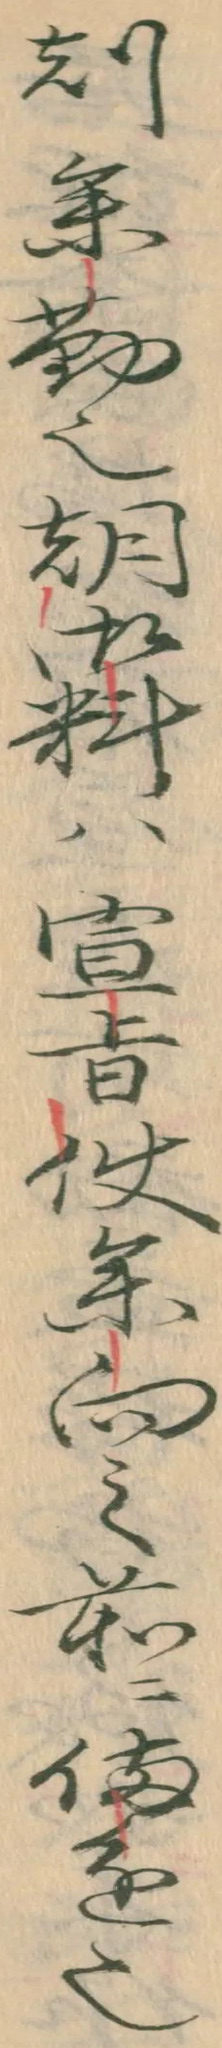刻参-勤也朝_御-料ハ宣-旨_使参-向之前ニ備-進也
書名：賀茂社記録. 第15冊
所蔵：国立国会図書館 National Diet Library, JAPAN
